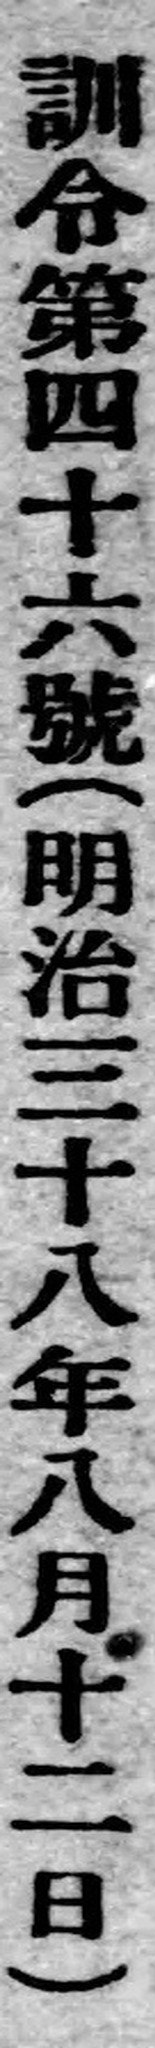訓令第四十六号號(明治三十八年八月十二日)
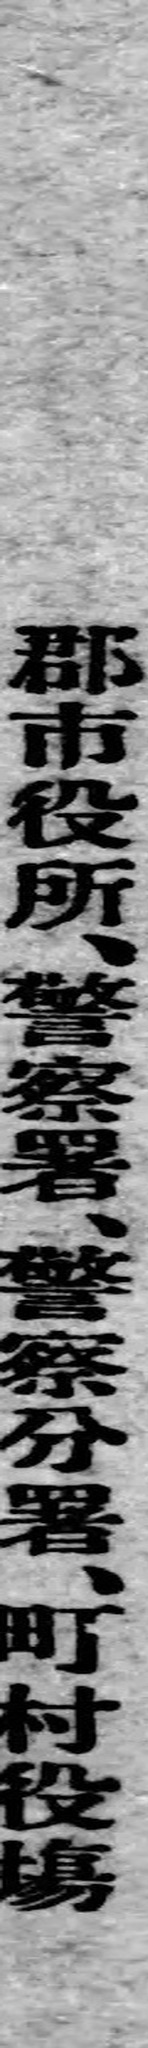群市役所、警察署、警察分署、町村役場
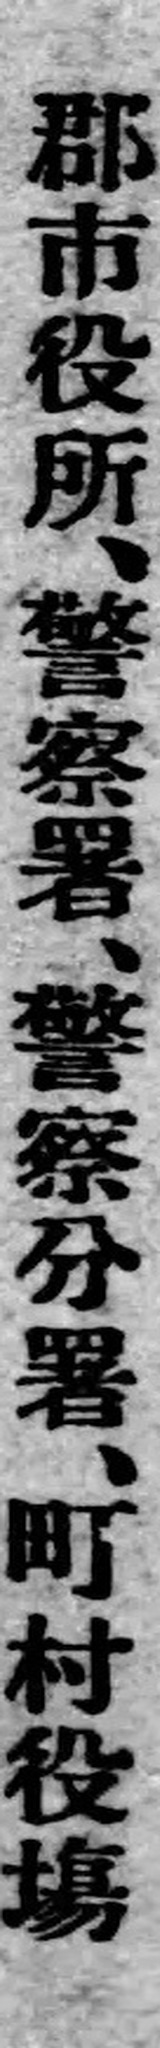群市役所、警察署、警察分署、町村役場
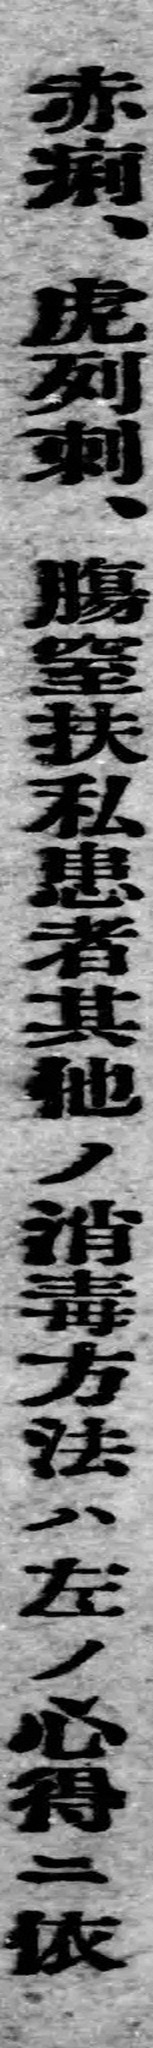赤痢、虎列刺、膓窒扶私患者其他ノ消毒方法ハ左ノ心得ニ依

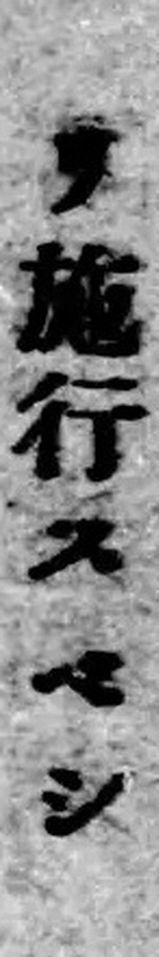リ施行スベシ
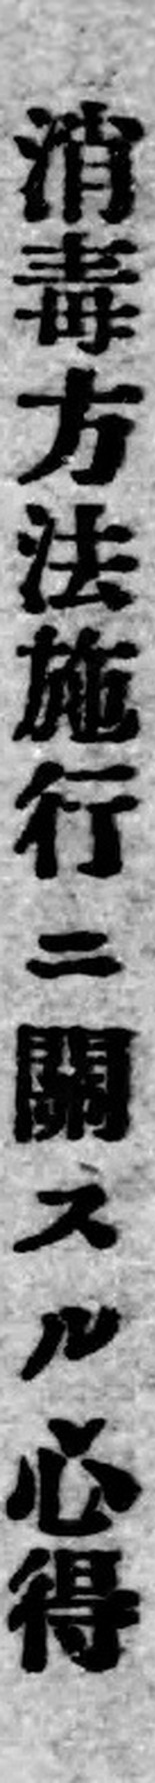消毒方法施行ニ關スル心得
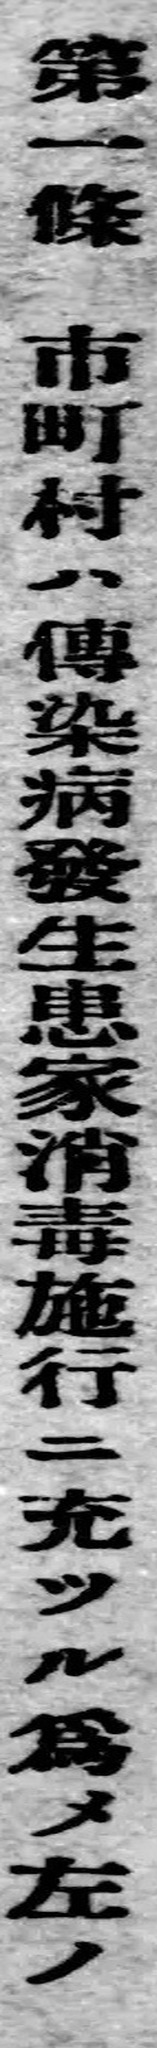第一條市町村ハ傅染病發生患家消毒施行ニ充ツル爲メ左ノ
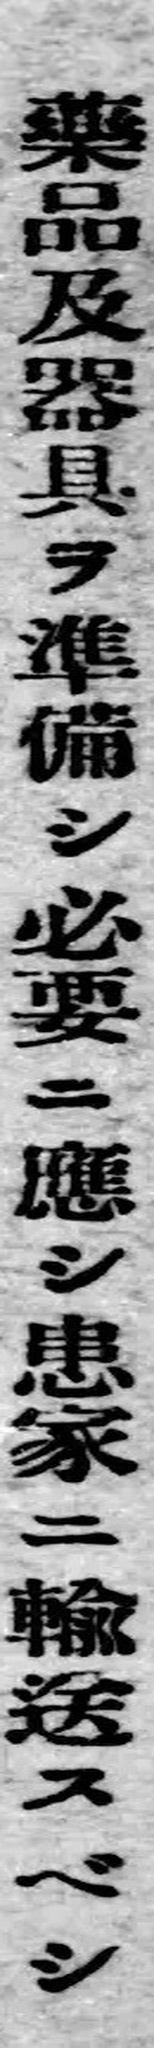藥品及器具ヲ準備シ必要ニ應シ患家ニ輸送スベシ
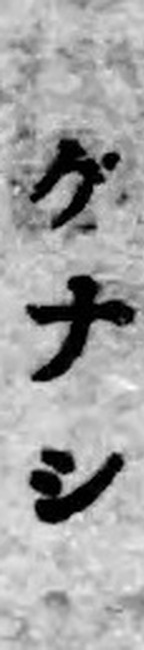ケナシ
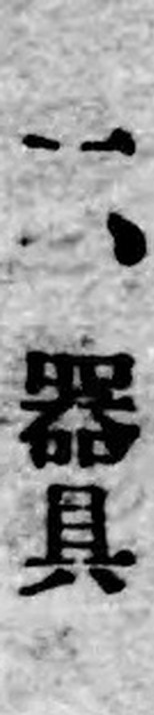一、器具
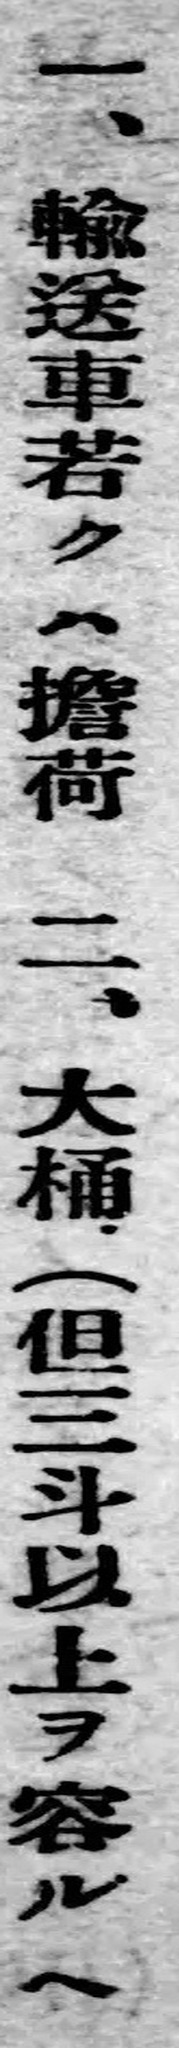一、輸送車若クハ擔荷二、大桶(但三斗以上ヲ容ルヘ
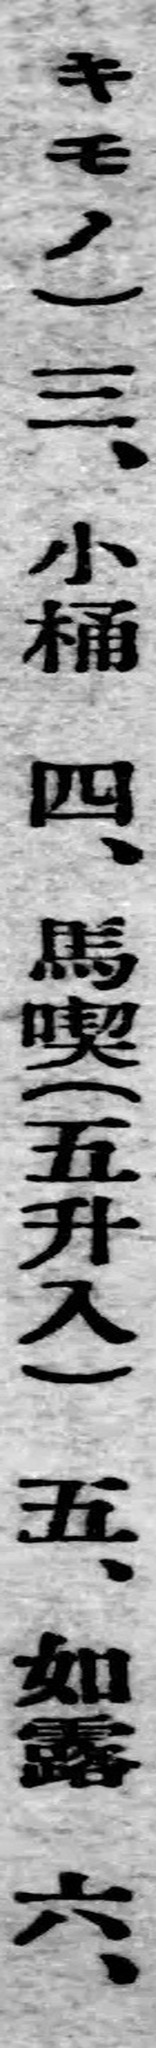キモノ)三、小桶四、馬喫(五升入)五、如露六、
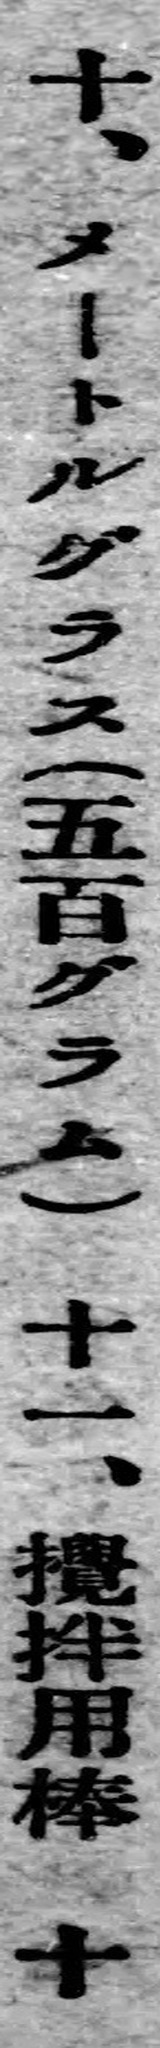十、メートルグラス(五百グラム)十一、攪拌用棒十
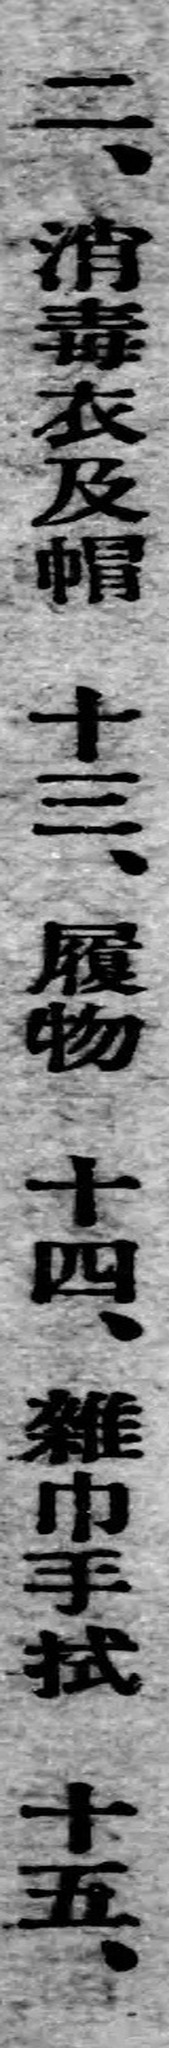二、消毒衣及帽十三、履物十四、雑巾手拭十五、
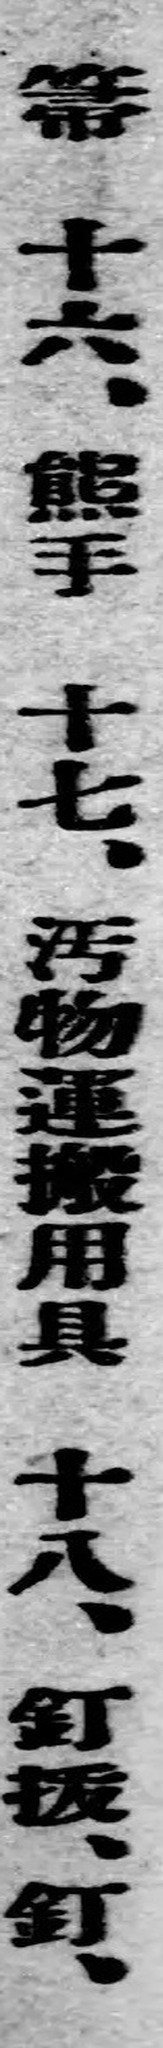箒十六、熊手十七、汚物運搬用具十八、釘抜、釘、
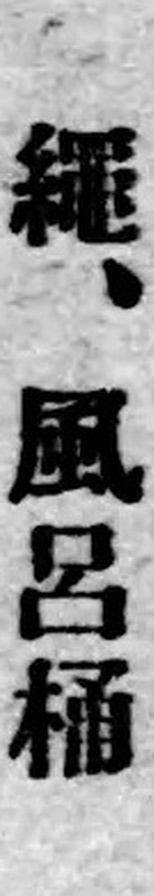縄、風呂桶
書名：袖珍防疫必携
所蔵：国立国会図書館 National Diet Library, JAPAN
